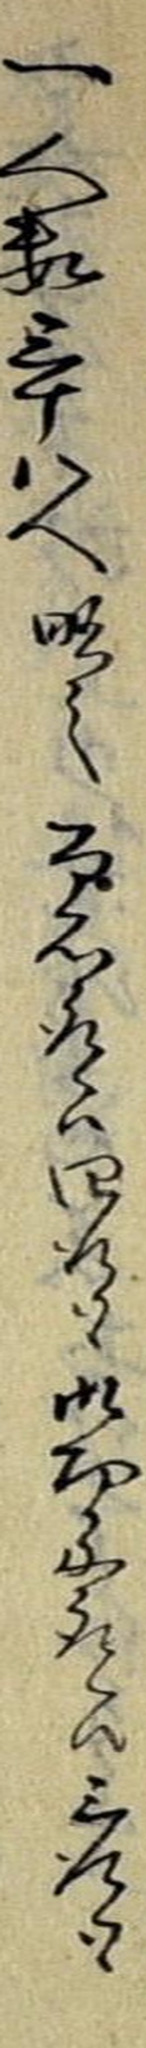一人数三十八人略之百石取へは四取つヽ御切米取へは三取つヽ
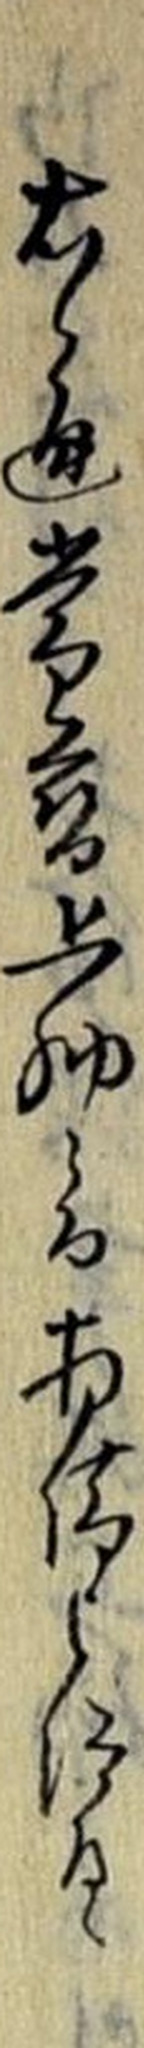右之通当暮上納に而拝借被仰付候
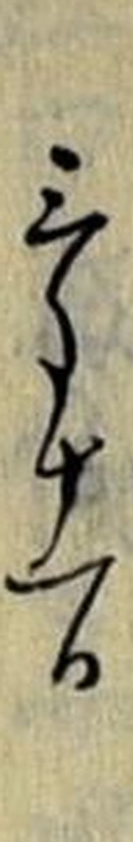三月十一日
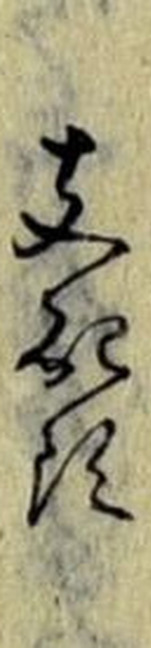支配頭
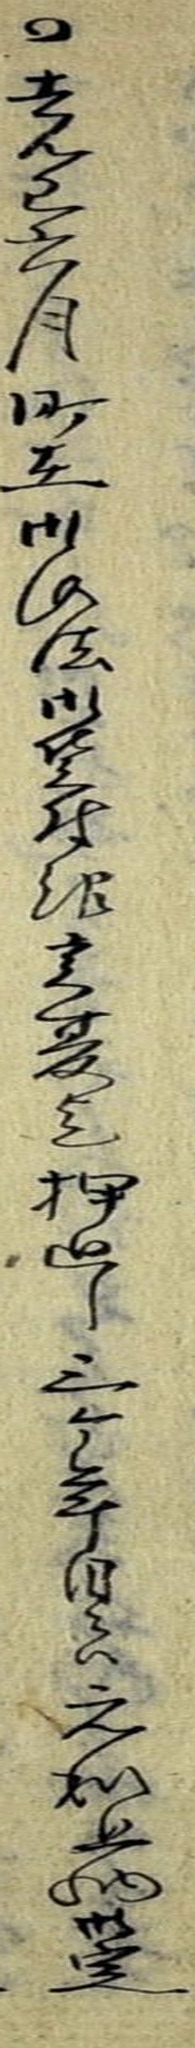○去巳年六月町在御趣法御貸付銀亥夏迄押廻し三ヶ年目には元利上納御定
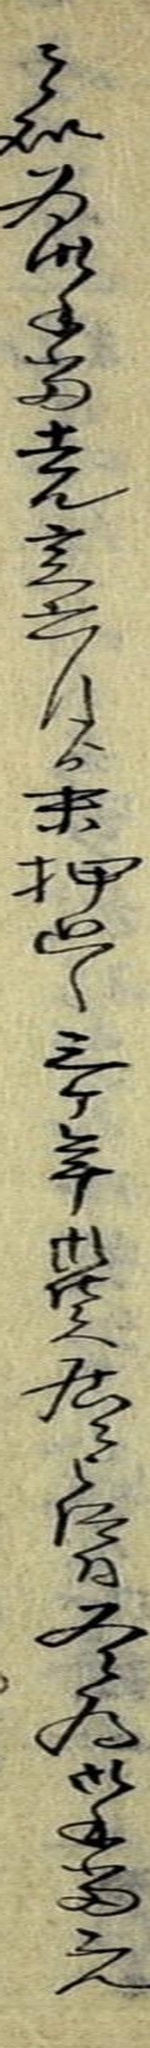に候処為御手当去ル亥六月ゟ未押廻し三ヶ年御貸居に被仰付又々為御手当元
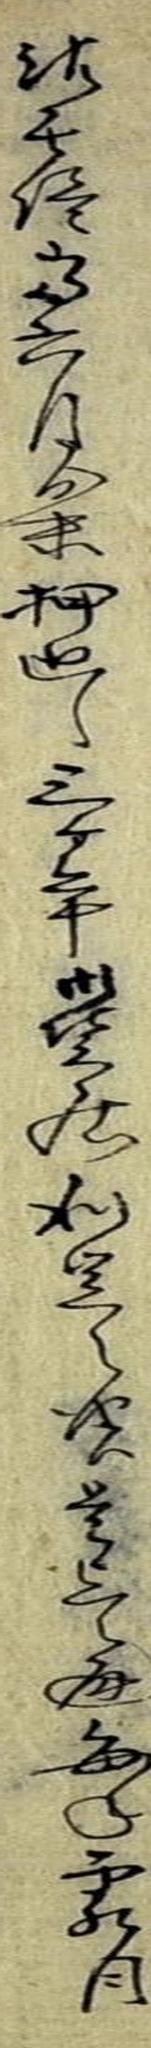銀其侭当六月ゟ未押廻し三ヶ年御貸居利息之儀は是迄之通毎年霜月
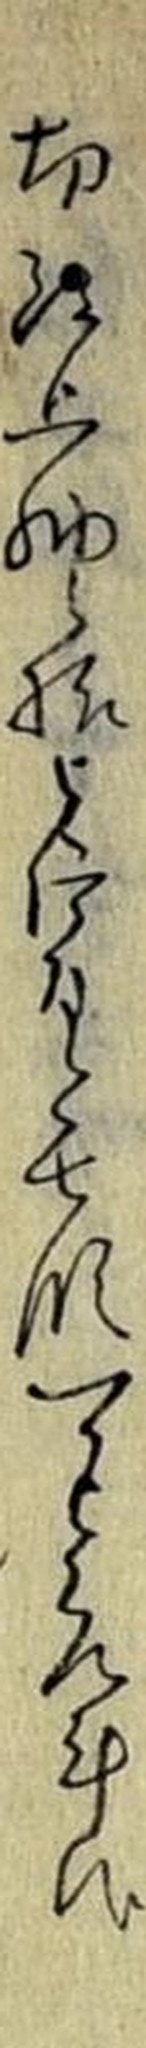切致上納候様被仰付候其段可被取斗事
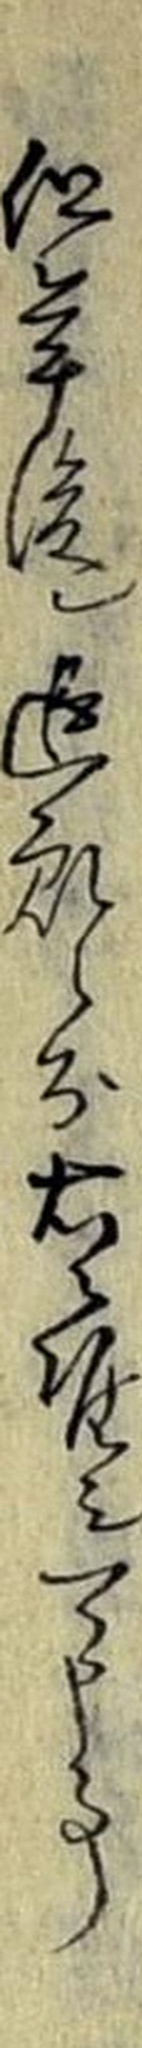但年後レ追願之分右に准し可申事
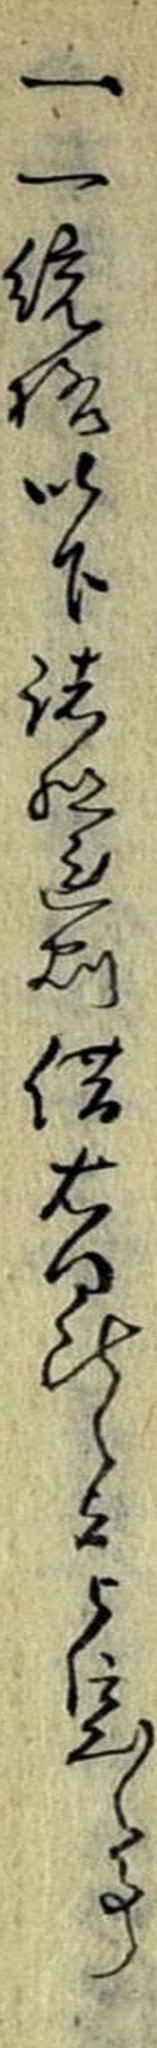一一統格以可諸組連判借右同断之旨被仰出候事
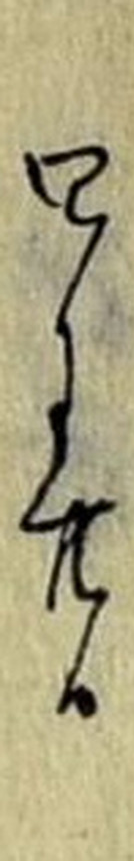四月廿日

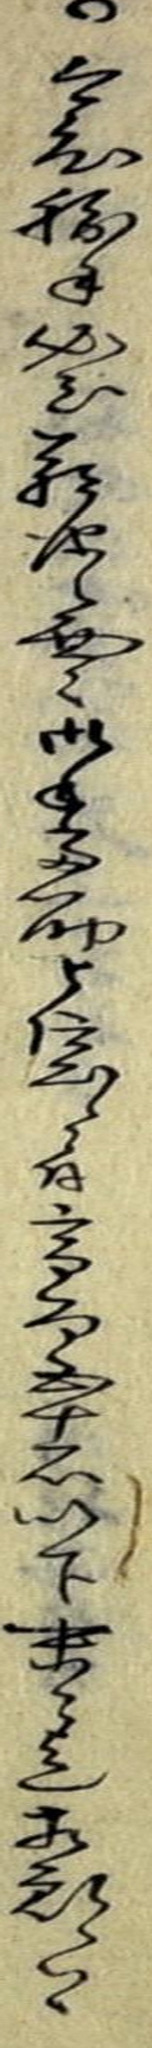○今度勝手必至難儀之面々御手当筋被仰出候に付高百五十石以下末々迄相願候はヽ
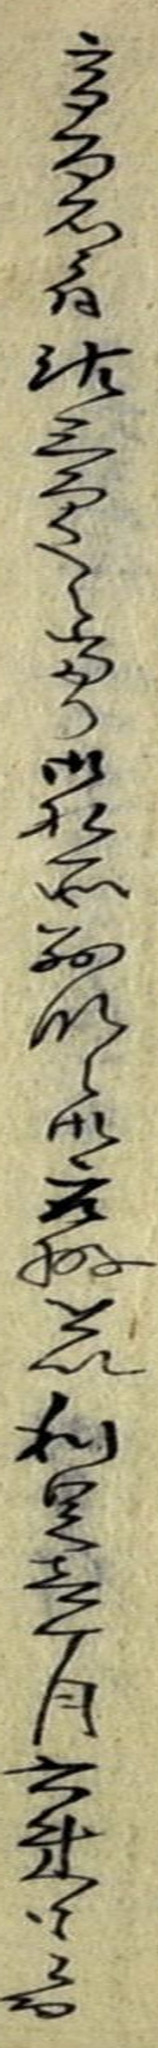高百石に付銀三百匁之当り御札所別段之御取扱を以利息壱ヶ月六朱つヽに而
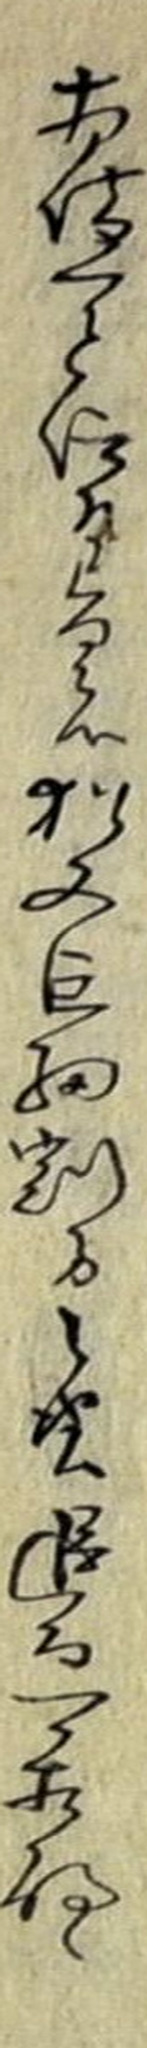拝借可被仰付候旨に候猶又巨細割方之儀は追而可相触候
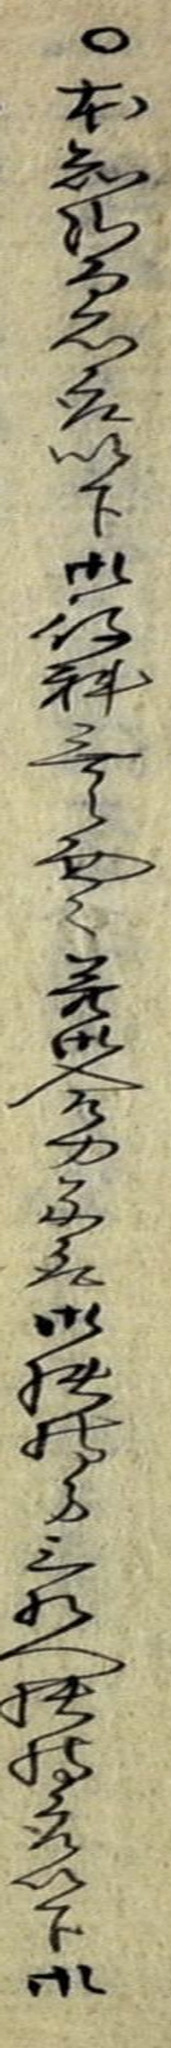○本知弐百石取以下御役料無之面々并御合力米取御扶持方三拾人扶持取以下御
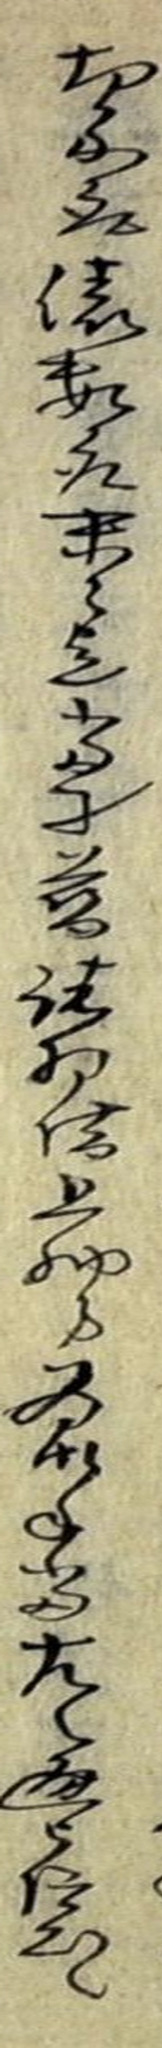切米取俵数取末々迄当寅暮請拝領上納方為御手当左之通被仰出候
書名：命令之部 四
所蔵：福井県文書館 Fukui Prefectural Archives
